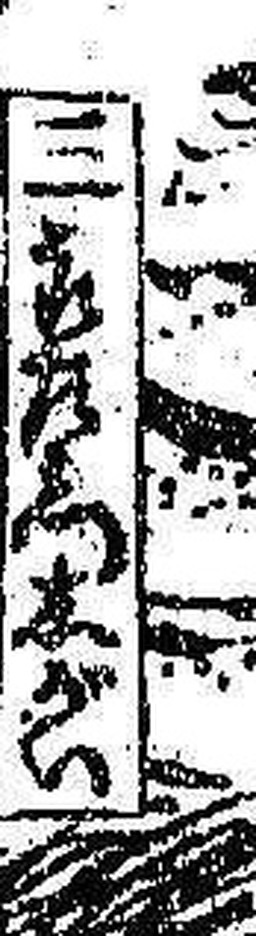三郎左衛門しがい

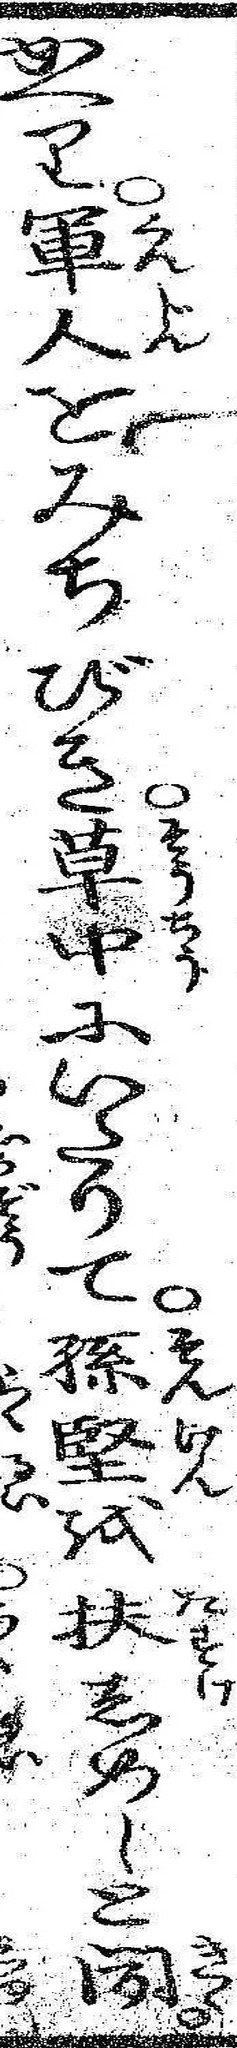かへり。軍人をみちびき。草中にいたりて。孫堅を扶しめしと聞。
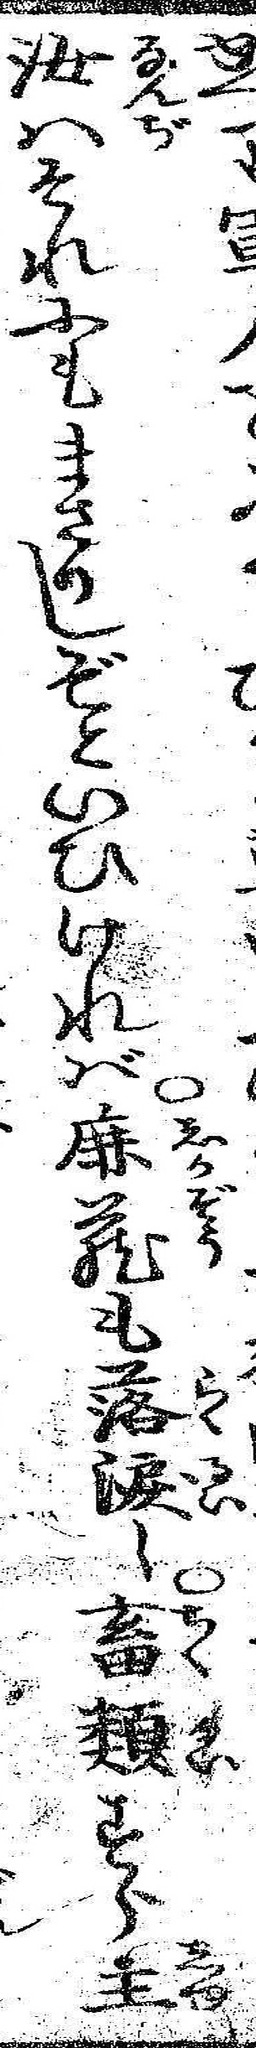汝はそれにもまさりしぞといひければ。鹿蔵も落涙し。畜類すら主
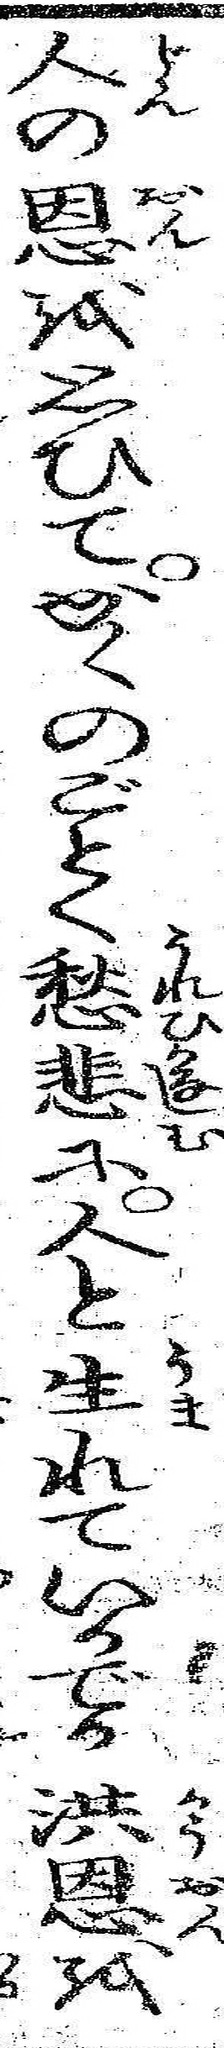人の恩を思ひて。かくのごとく愁悲に。人と生れていかでか洪恩を
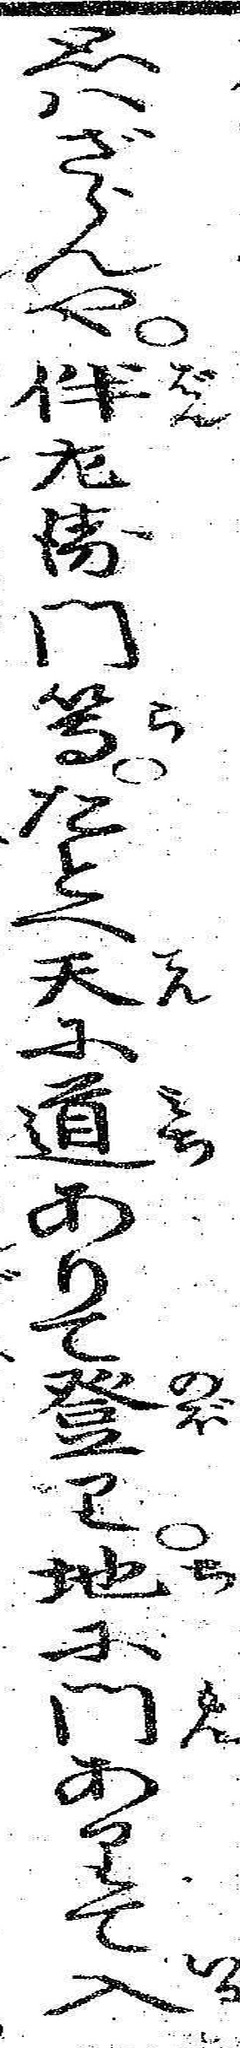思はざらんや。伴左衛門等。たとへ天に道ありて登り。地に門ありて入
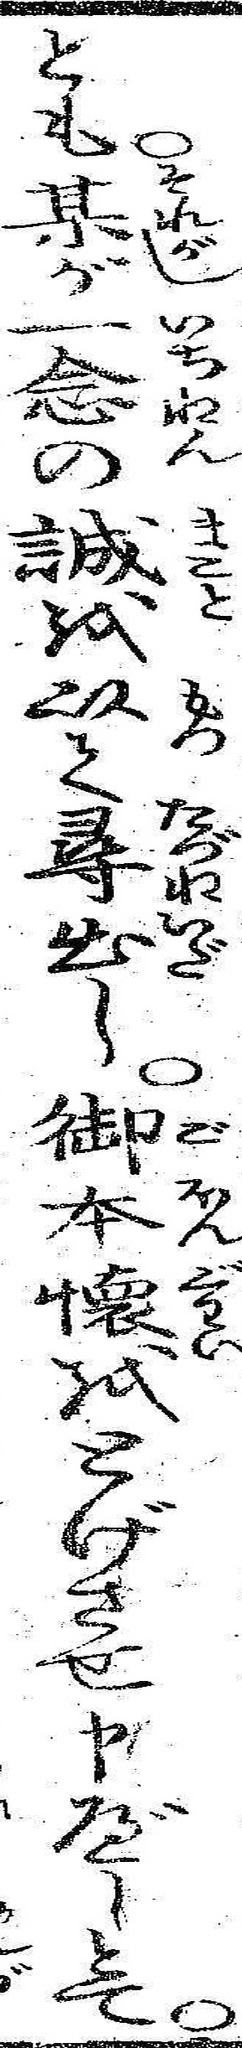とも。某が一念の誠を以て尋出し。御本懐をとげさせ申べしとて。
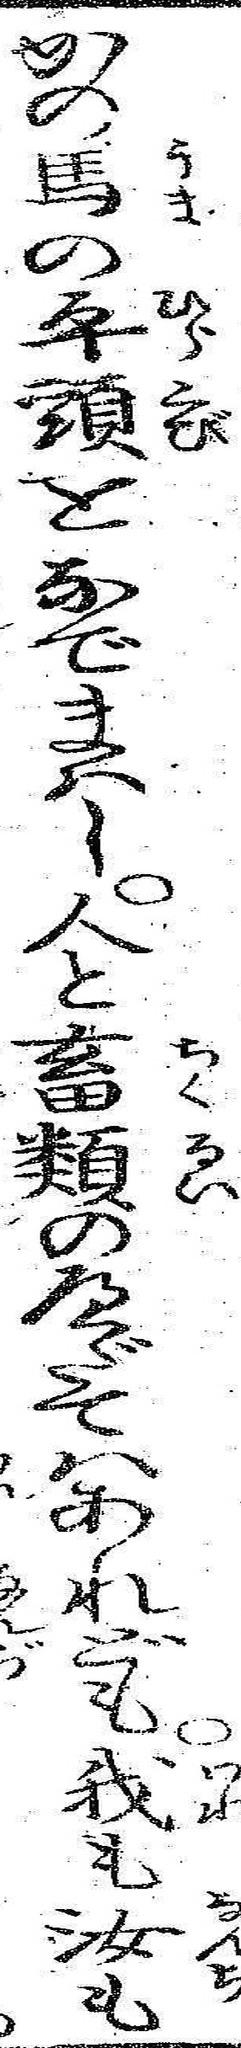かの馬の平頸をなでまはし。人と畜類のへだてはあれども。我も汝も
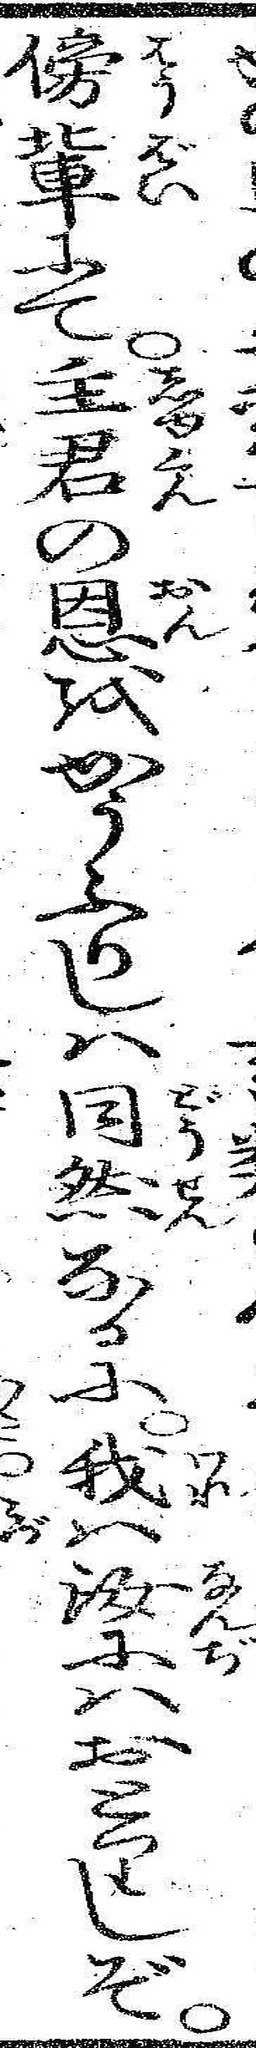傍輩にて。主君の恩をかうふりしは同然なるに。我は汝にはおとりしぞ。
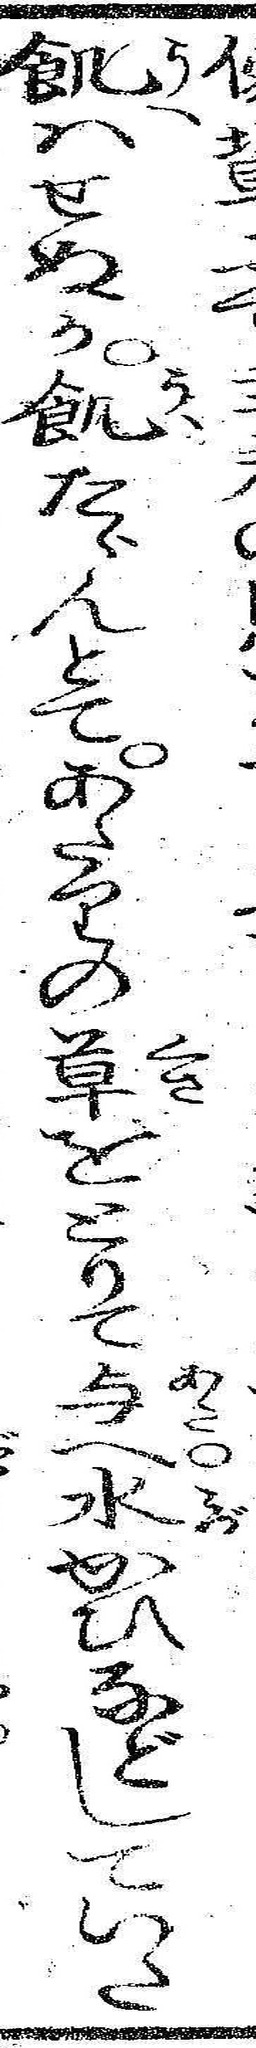飢はせぬか。飢たらんとて。あたりの草をとりて与へ。水かひなどしていた
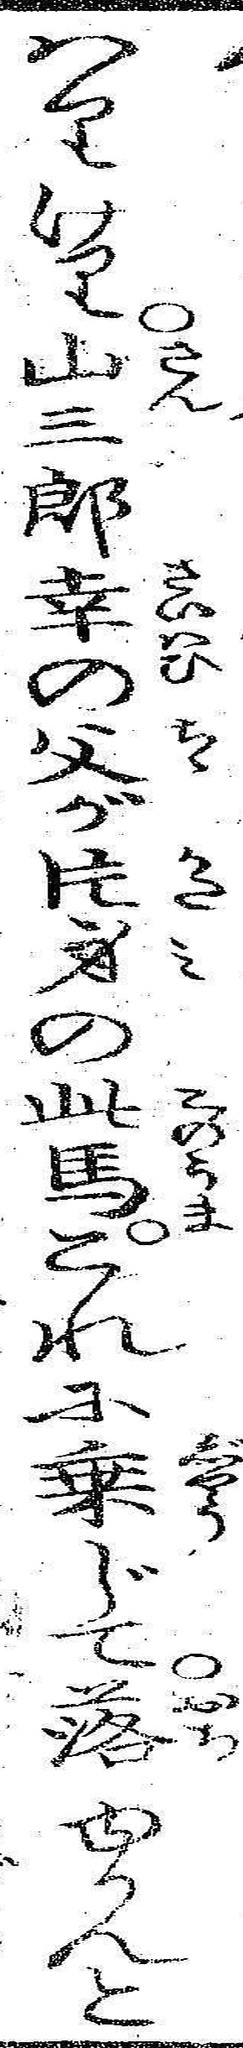はりけり。山三郎幸の父が片身の此馬。これに乗じて。落ゆかんと
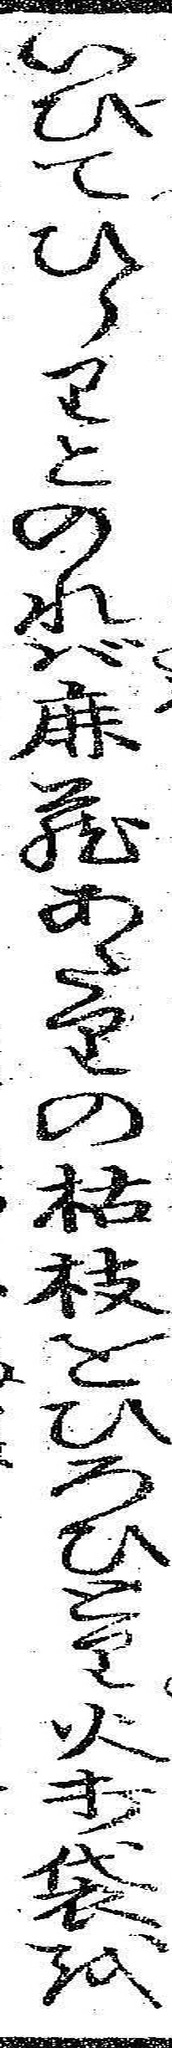いひて。ひらりとのれば。鹿蔵あたりの枯枝をひろひとり。火打袋を
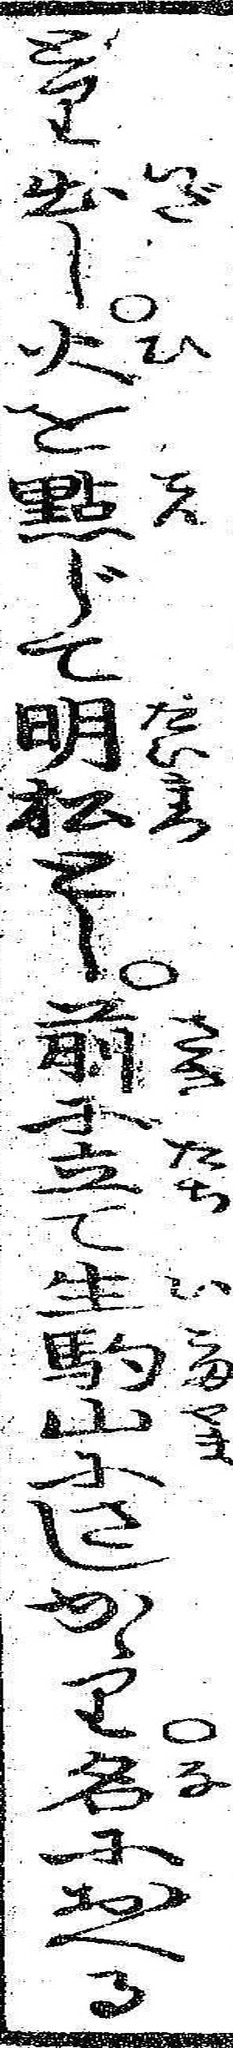とり出し。火を点じて明松とし。前に立て生駒山にさしかゝり。名におへる
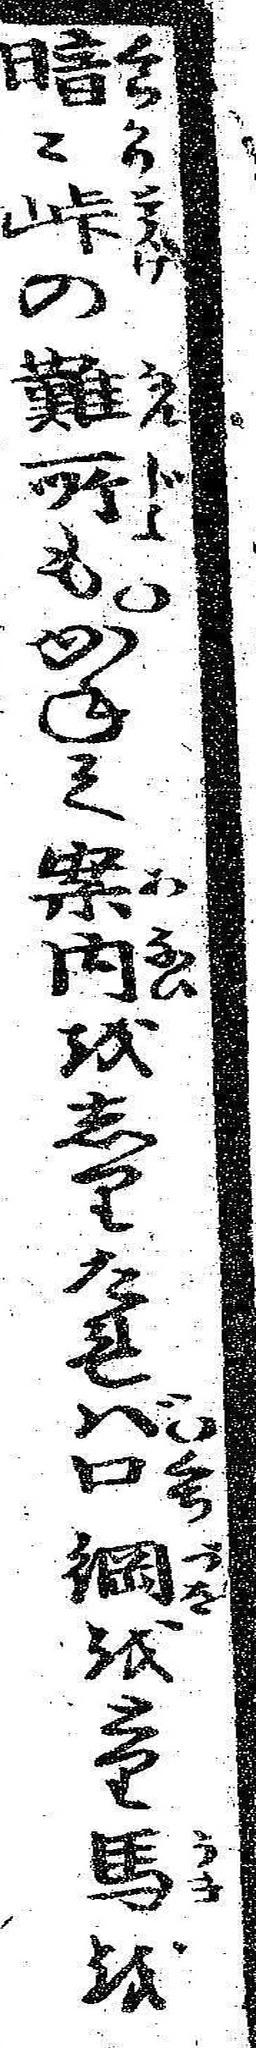暗々峠の難所も。かねて案内をしりたれば。口綱をとり馬を
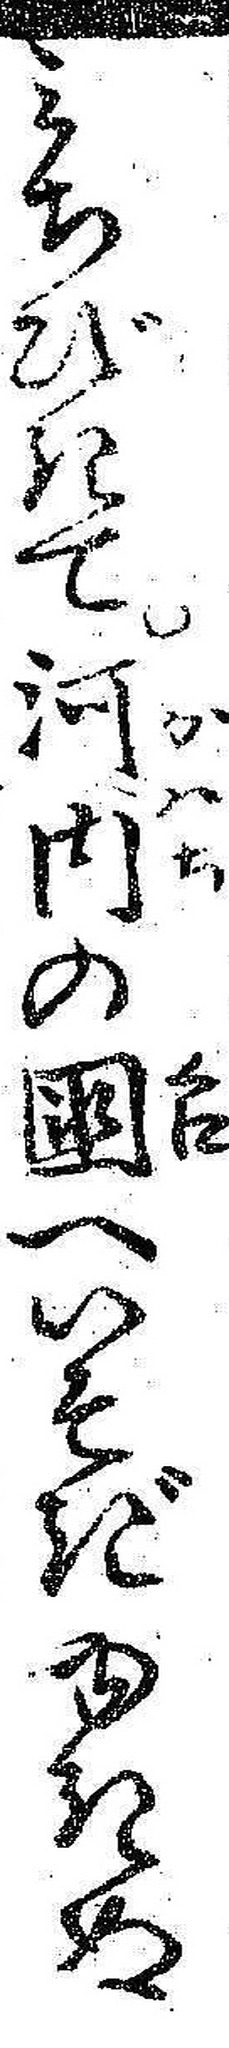みちびきて。河内の国へいそぎゆきぬ
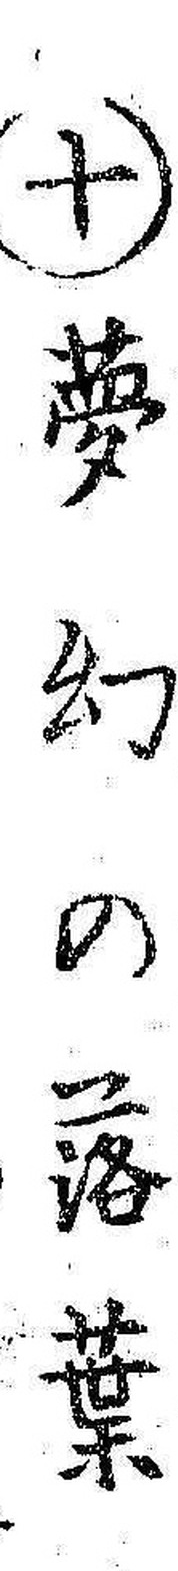十夢幻の落葉
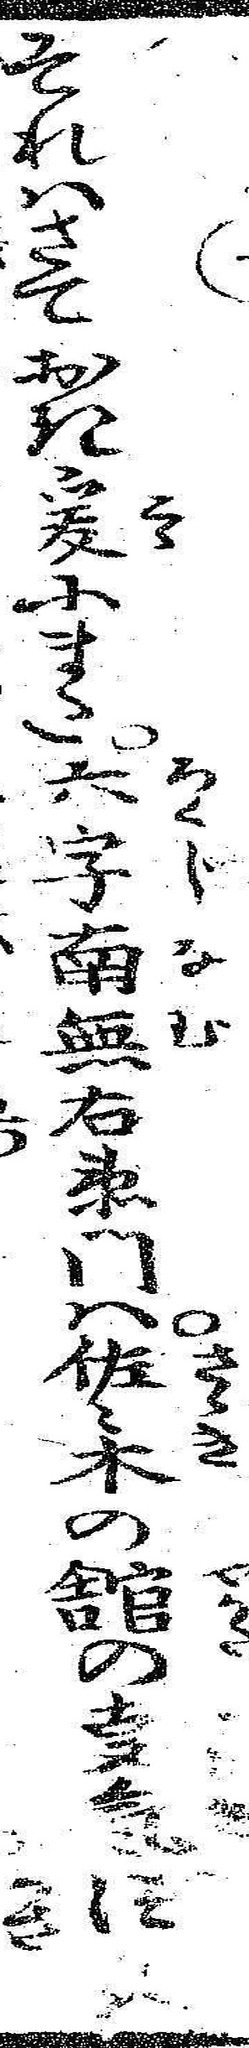それはさておき爰にまた。六字南無右衛門は。佐々木の館の事気づかは
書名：昔話稲妻表紙
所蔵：国文学研究資料館
